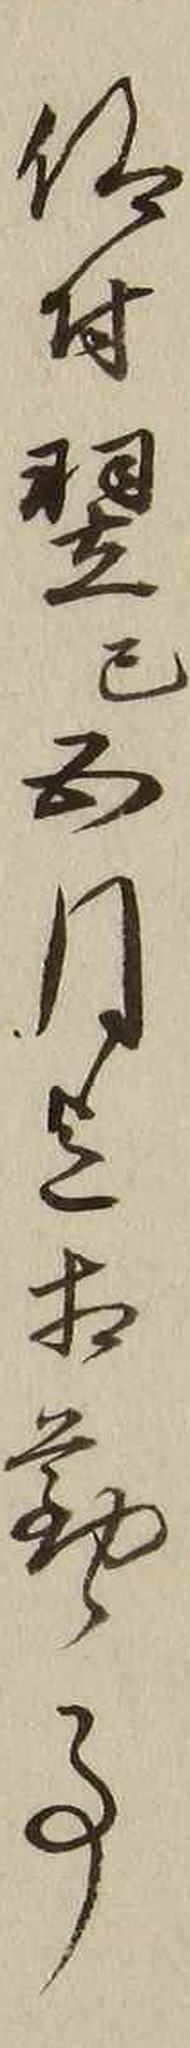仰付翌巳五月迄相勤候事
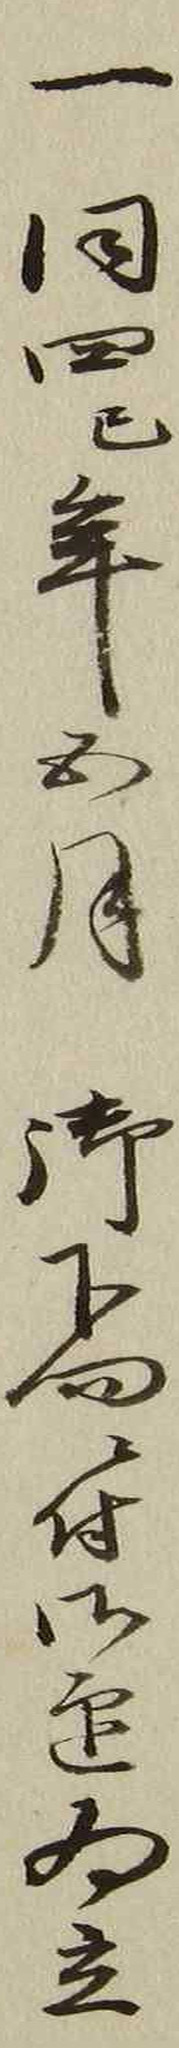一同四巳年五月御下向ニ付御迎為立
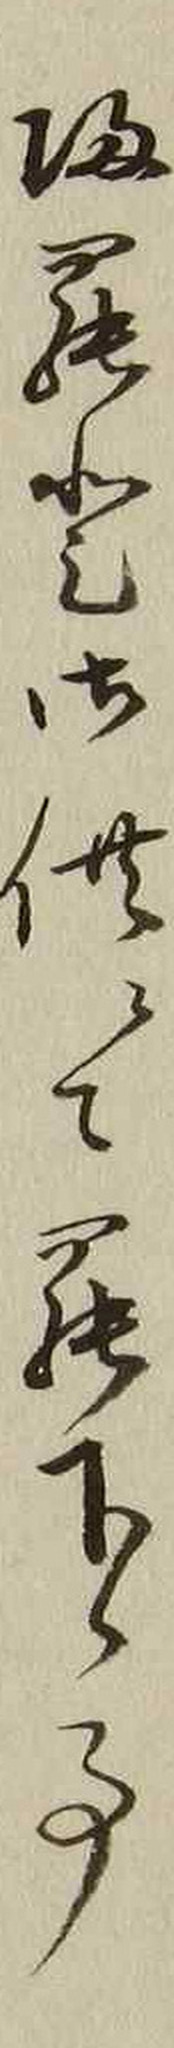帰罷登御供ニて罷下候事
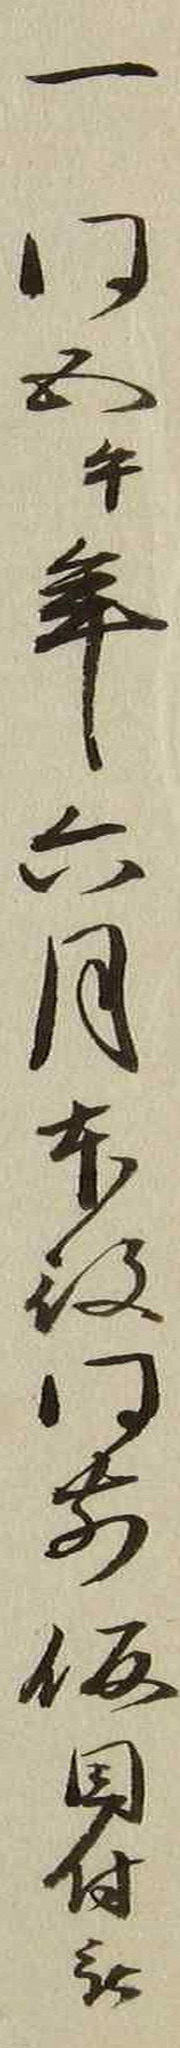一同五午年六月本役同前仮目付被
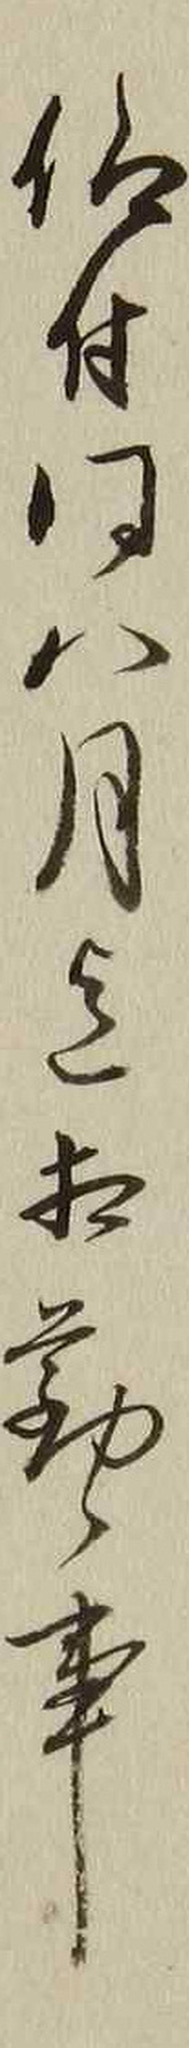仰付同八月迄相勤候事
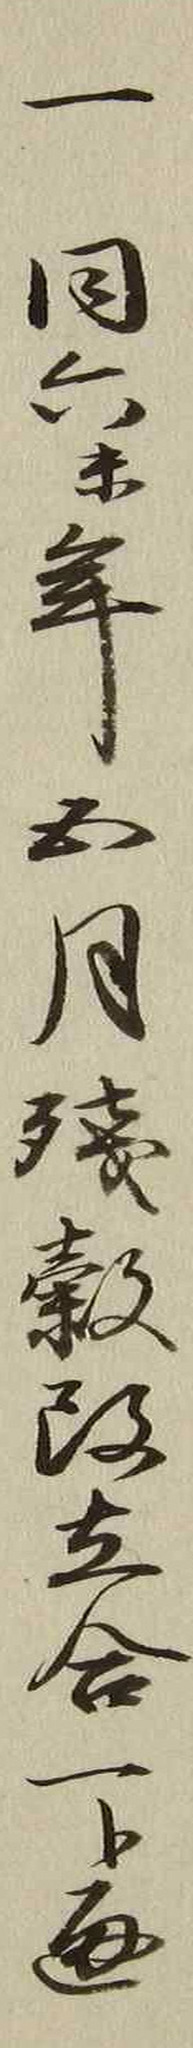一同六未年五月残穀改立合一ト通
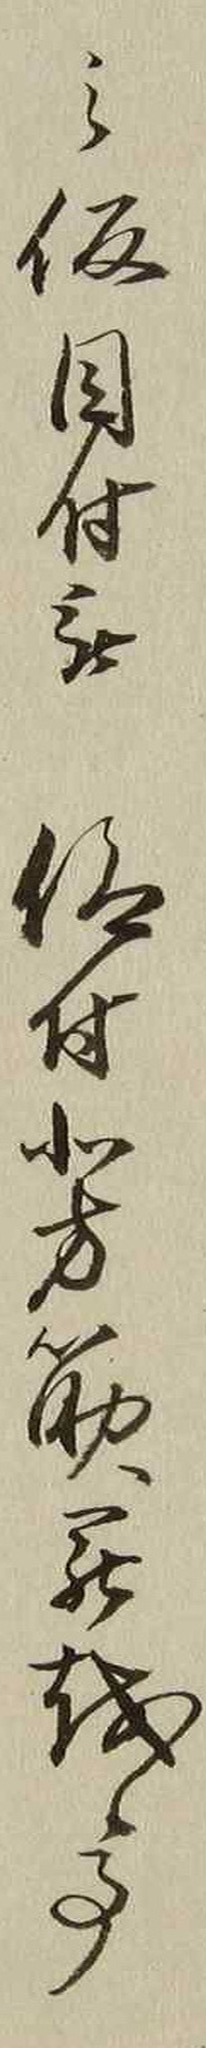之仮目付被仰付北方筋へ罷越候事
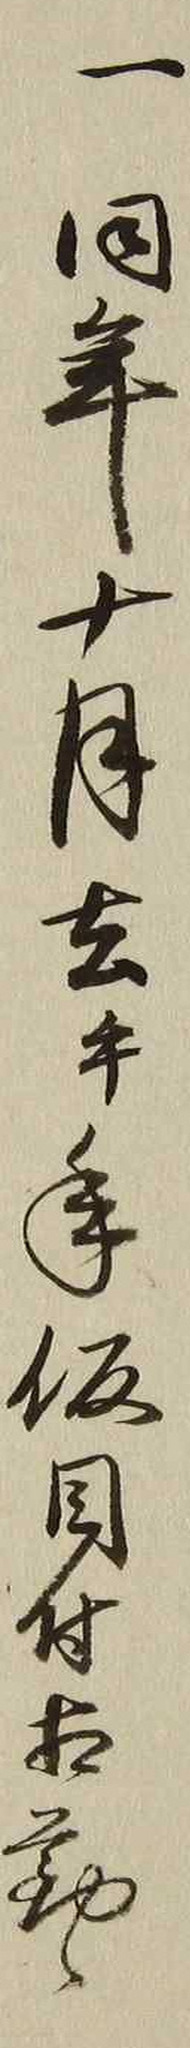一同年十月去午年仮目付相勤候
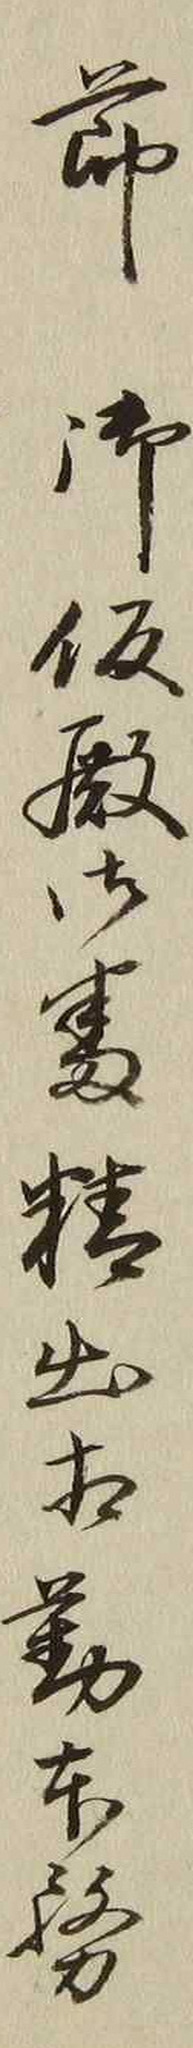節御仮殿御番精出相勤本務
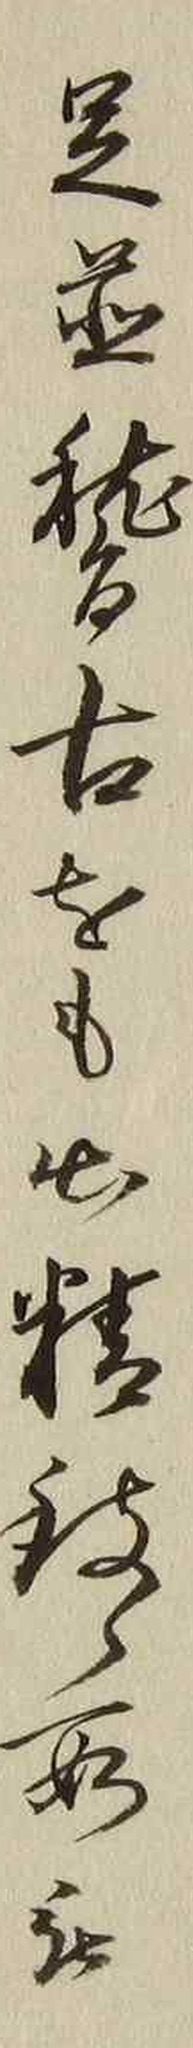足並稽古をも出精致候段被
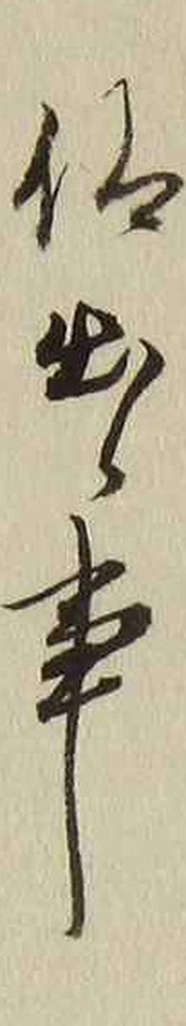仰出候事
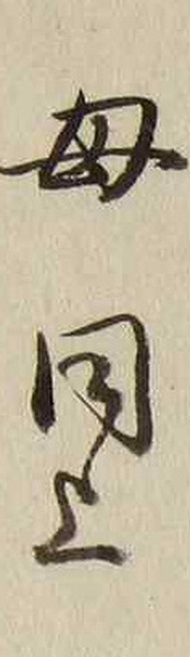母同上

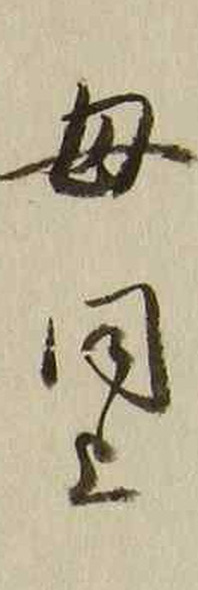母同上
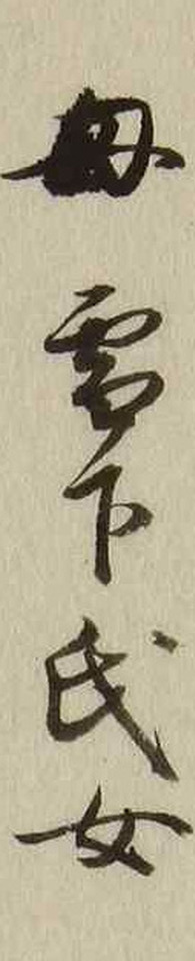母雪下氏女
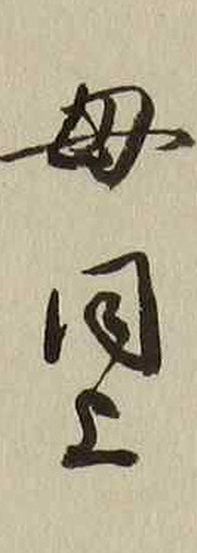母同上
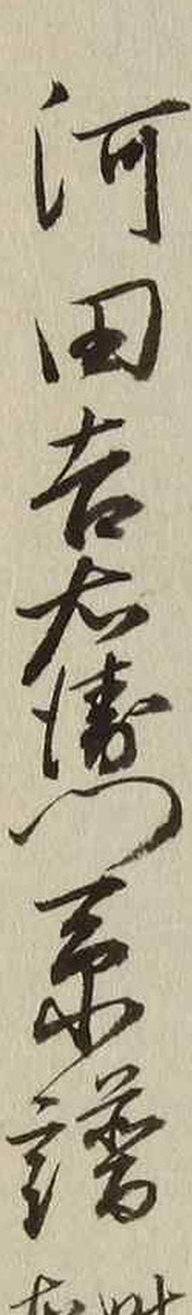河田甚右衛門真明
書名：諸士系譜　巻之102　か之部10
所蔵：会津若松市立会津図書館
